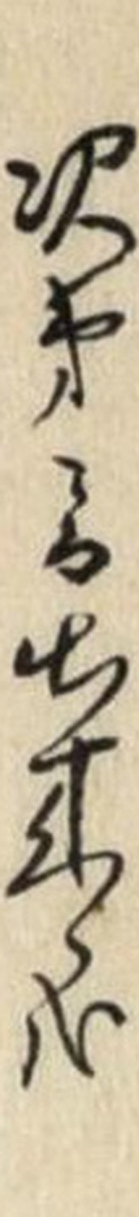次第ニ而出来候哉
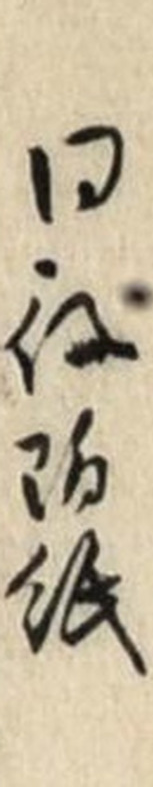同役附紙
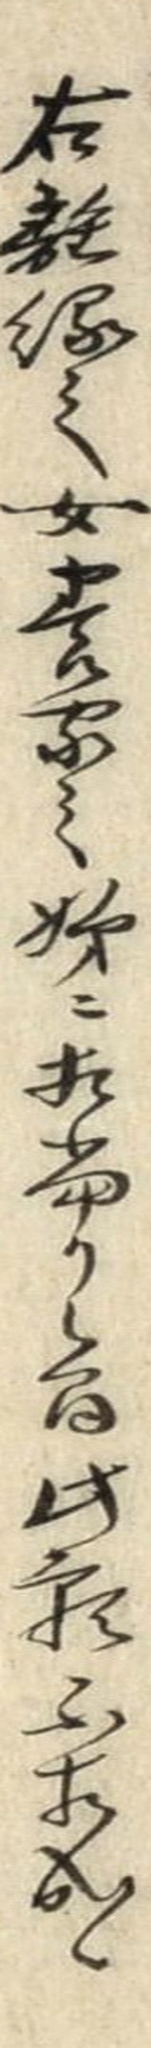右離縁之女養家之姉ニ相当り候間此願不相成候
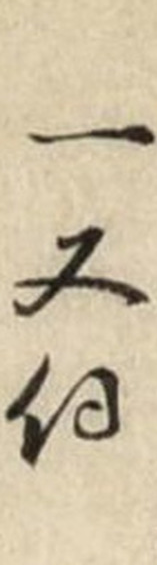一又伺
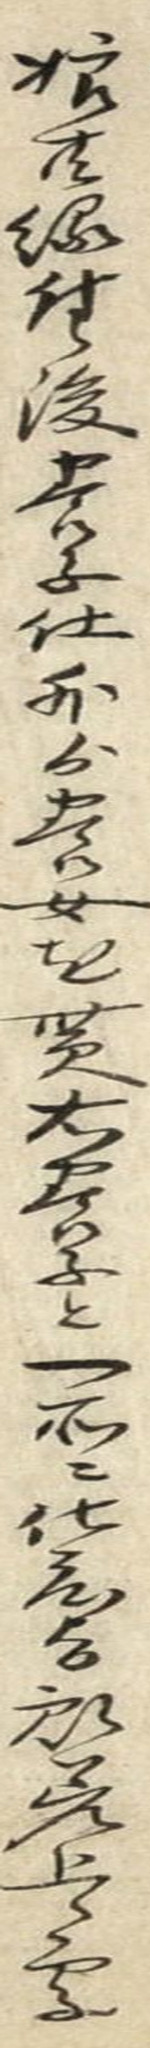娘共縁付候後養子仕外ゟ養女を貰右養子と一所ニ仕度旨願差上候処
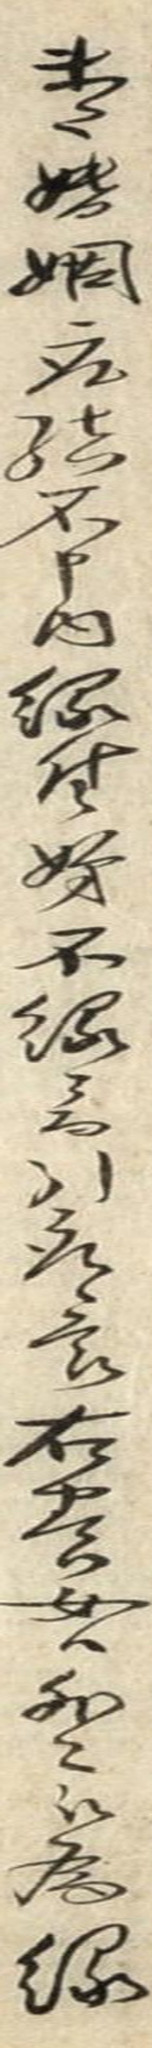未た婚姻取結不申内縁付姉不縁ニ而引取候節右養女ハ外ニ被為縁
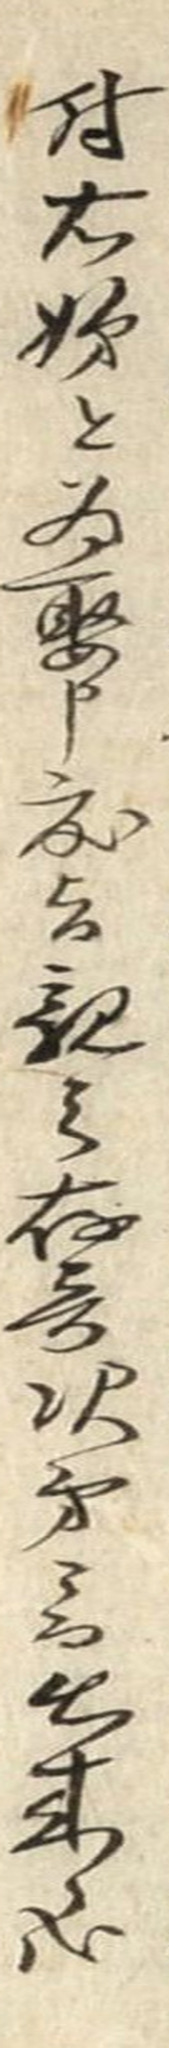付右姉と為娶申度旨親之存寄次第ニ而出来候哉
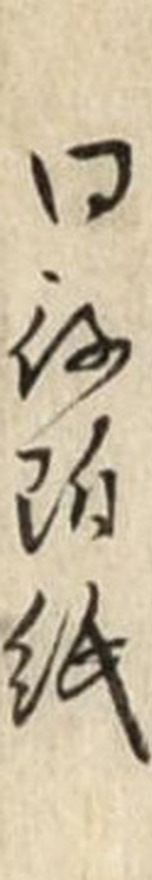同役附紙
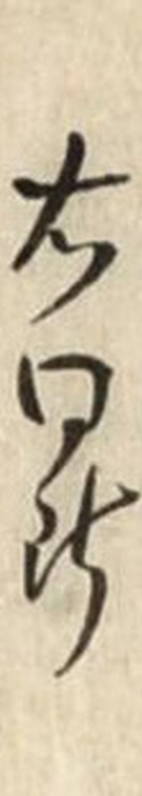右同断
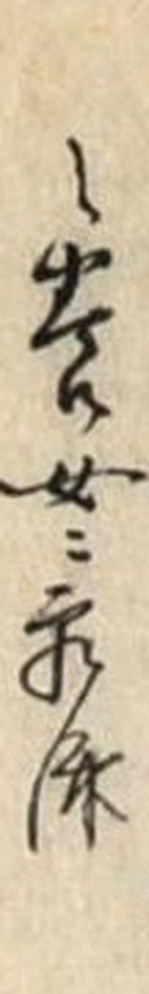之養女ニ願済

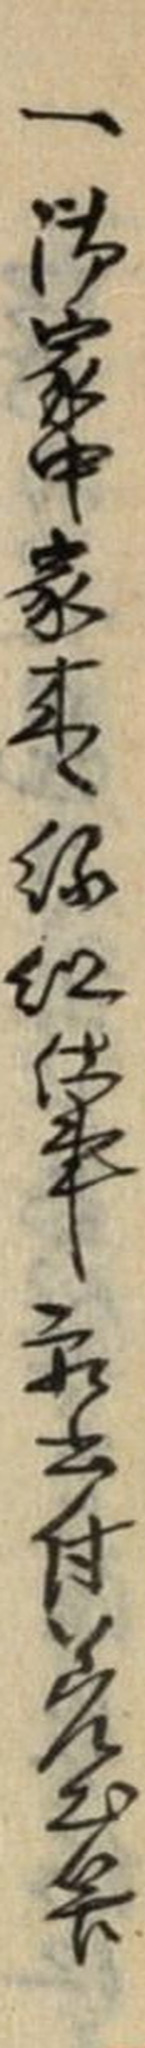一御家中家来へ縁組仕事願書付差出筈
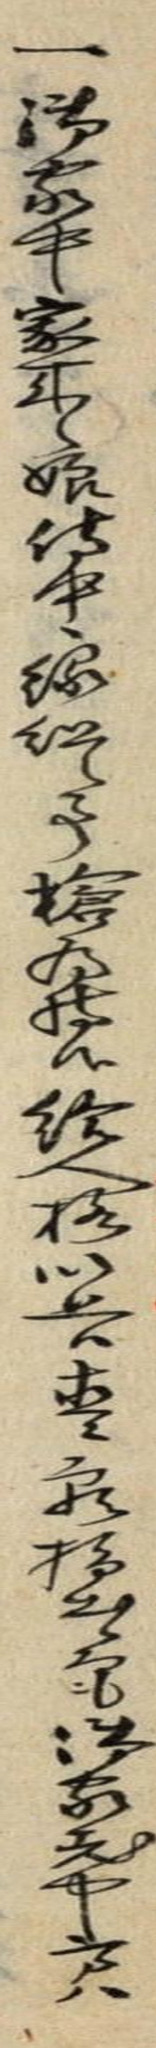一御家中家来之娘侍中へ縁組候事槍為持候給人格以上ハ直ニ願指出候而も御家老中方ハ
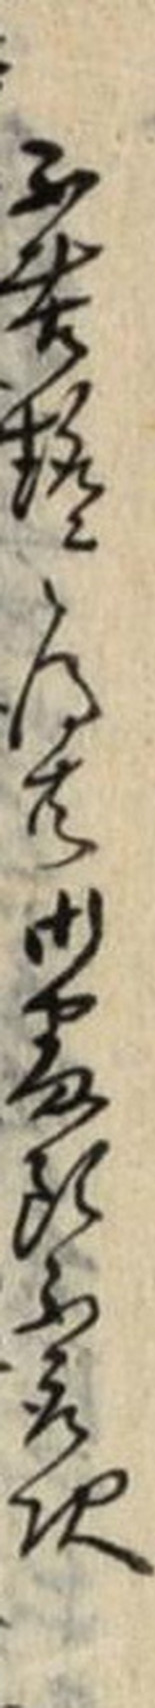不苦趣ニ候得共御番頭不取次
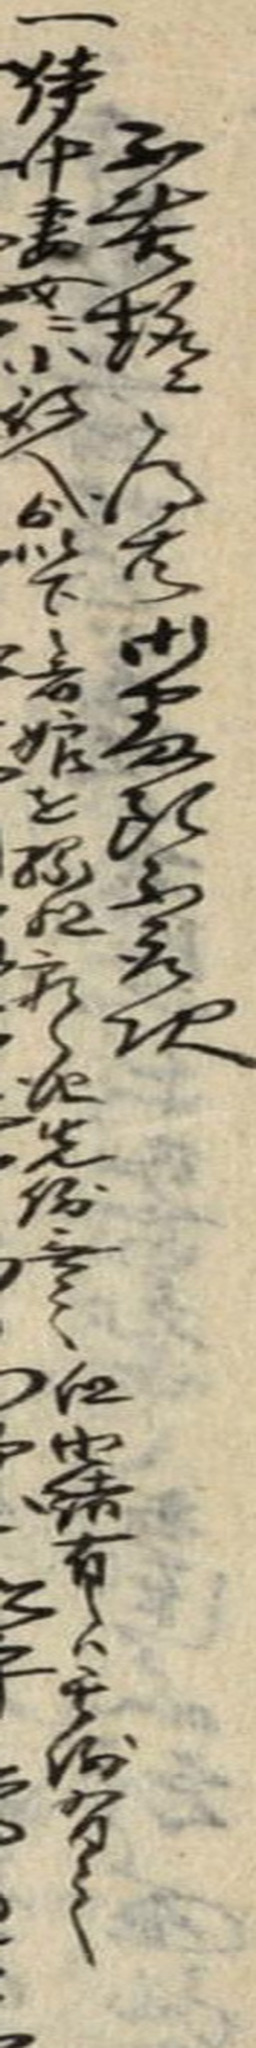一侍中妻女ニ小役人ゟ以下之者娘を縁組願之儀先例無之但由緒有之ハ其例有之
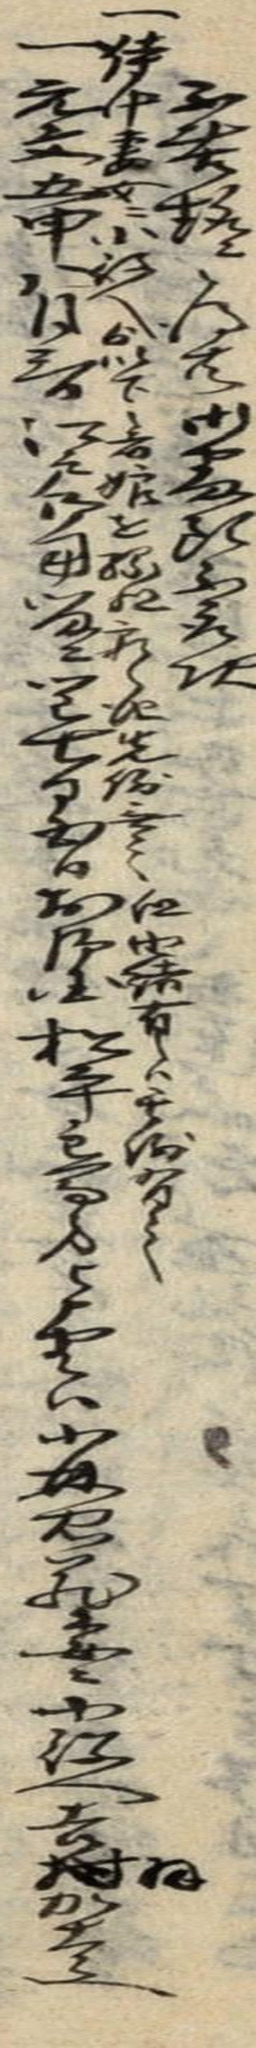一元文五申八月三日江戸御用留ニ閏七月五日於御国松平主馬方被申聞ハ小林忠蔵妻ニ小役人吉一村羽加太夫
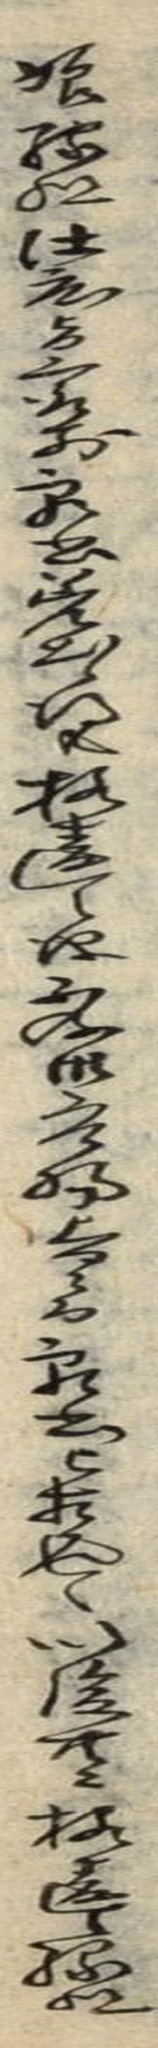娘縁組仕度旨最前願書差出候得共格違之儀不及御取揚旨ニ而願書被相返候以後共ニ格違之縁組
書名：養子縁組之部
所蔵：福井県文書館 Fukui Prefectural Archives
